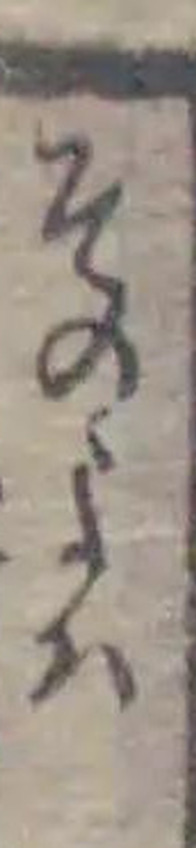そのよは
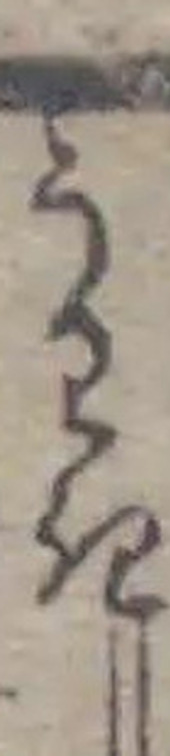うわき
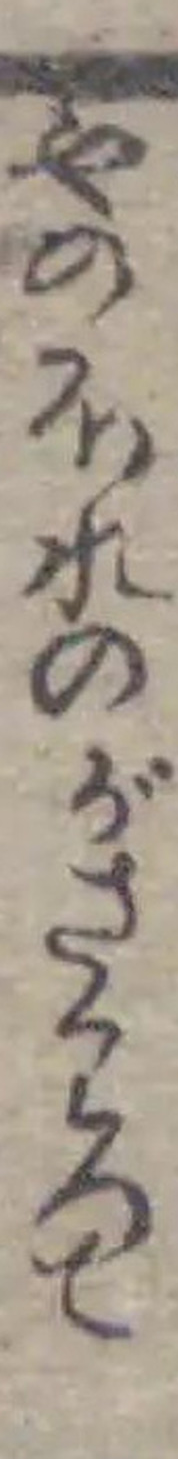やのほれのがさわつて
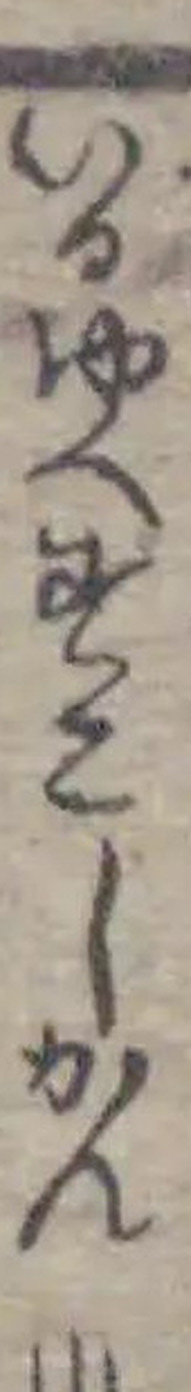いるゆへすこしかん
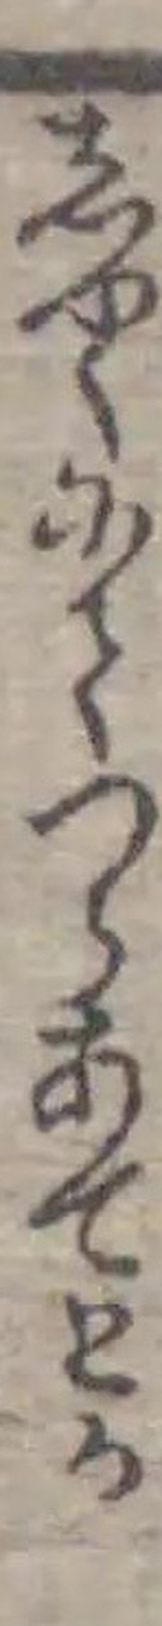しやくにてつらあてとか
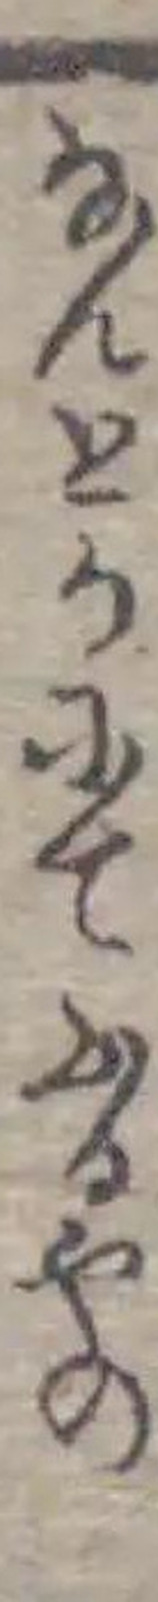なんとかにてふるやの
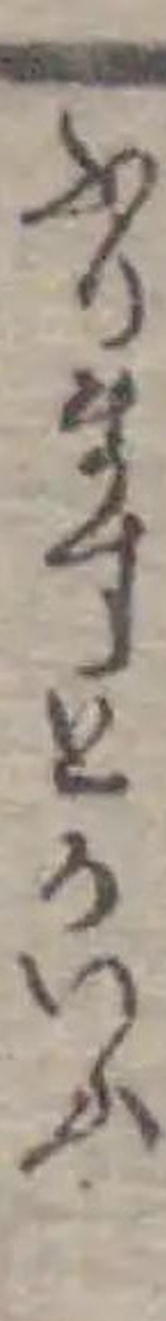ふりますとかいふ
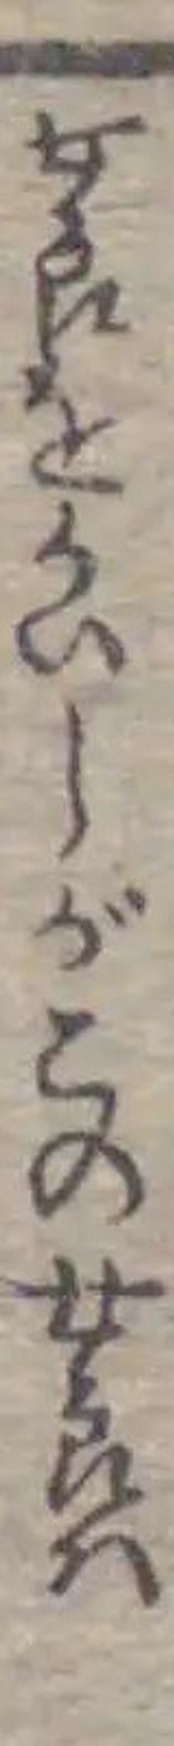女郎をかいしがこの女郎は
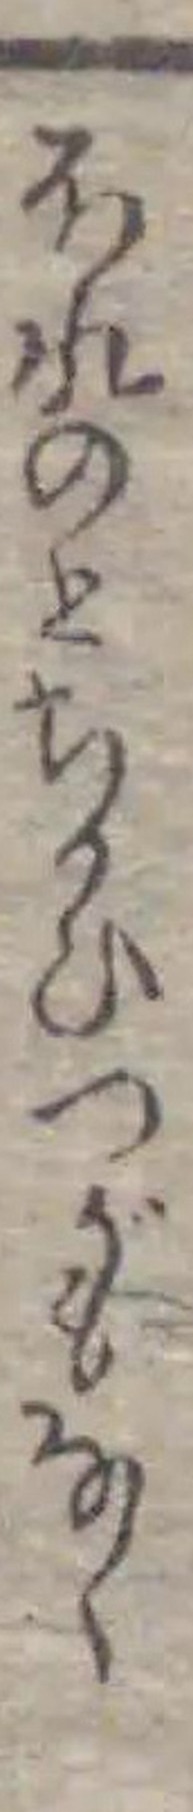ほれのとちかひつがもなく
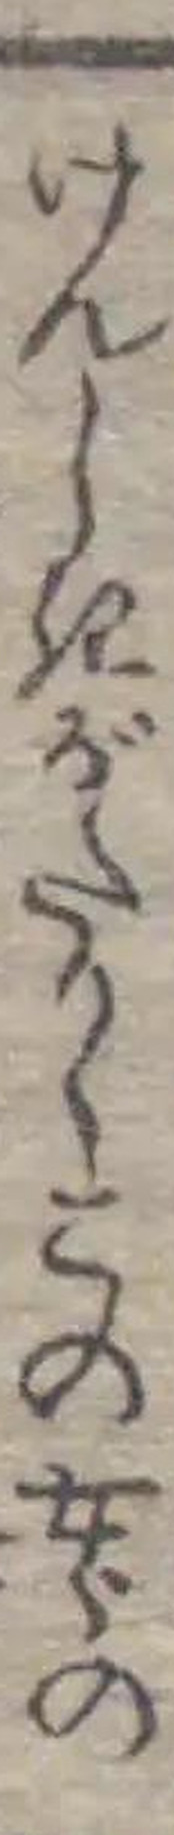けんしきがたかくこの女郎の
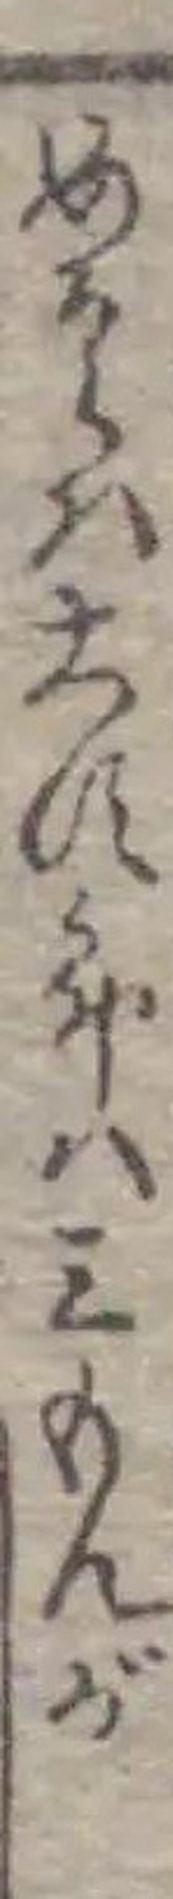めからは大次郎はさんもんが
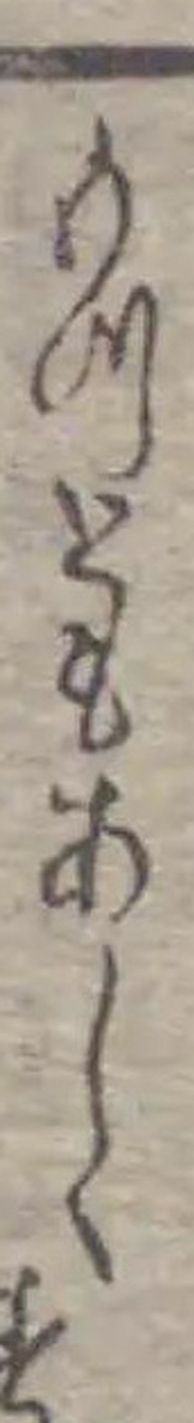もつともあしくする
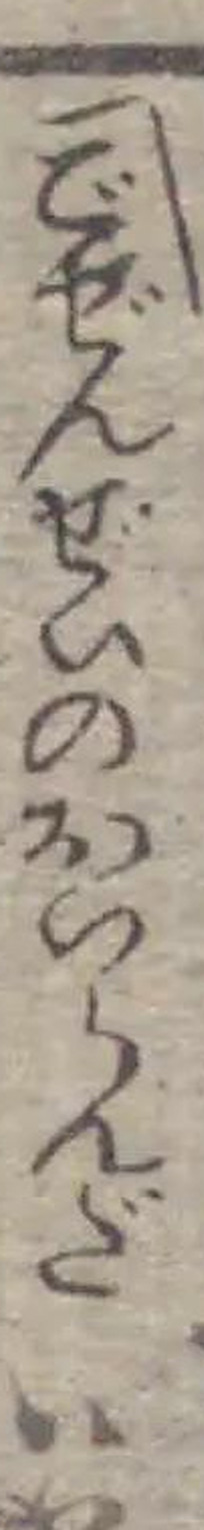〽ごぜんぜいのおいらんだ
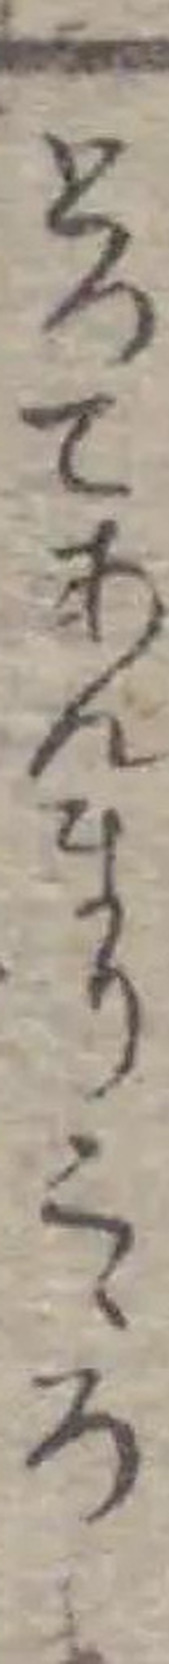とつてあんまりこゝろ
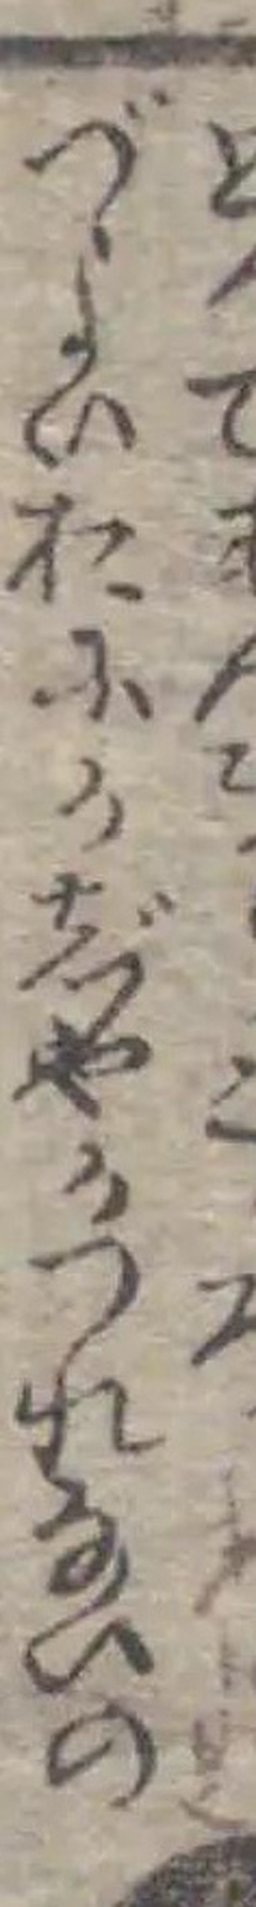づよいおにかじやかつれないの
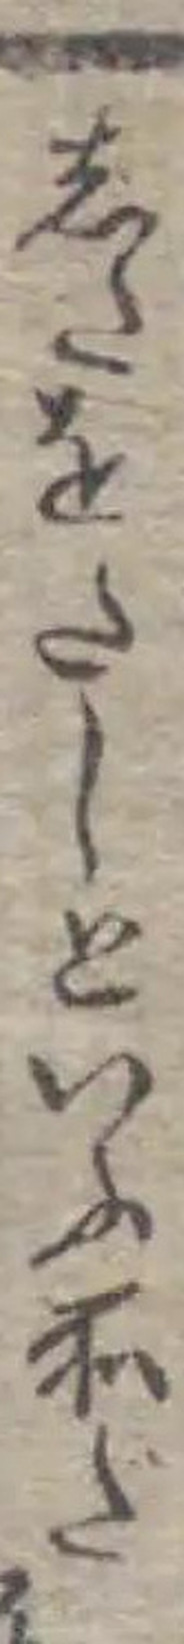したをたしといふ所だね
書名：福壽海旡量品玉 3巻
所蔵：国立国会図書館 National Diet Library, JAPAN
